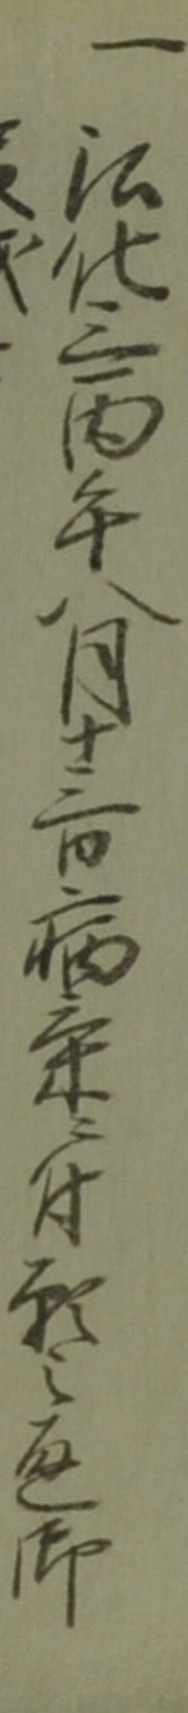一弘化三丙午八月十三日病気ニ付願之通御
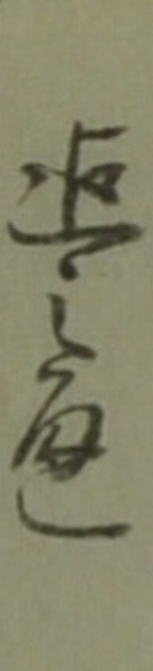迄之通
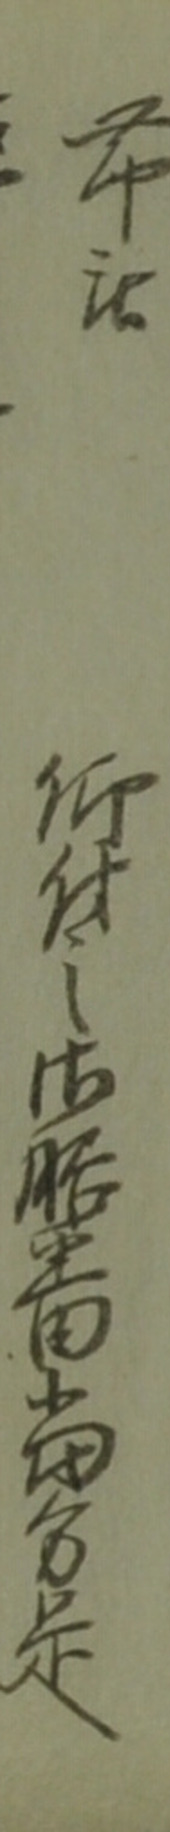帯被仰付之御膳番当分是
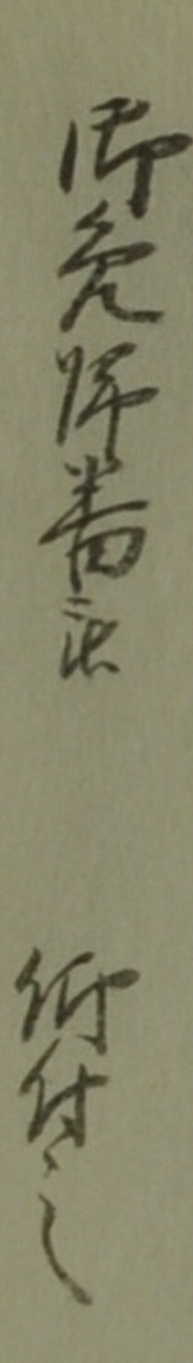御免帰番被仰付之
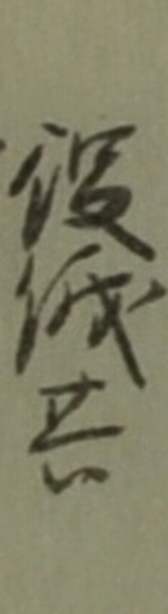役儀共
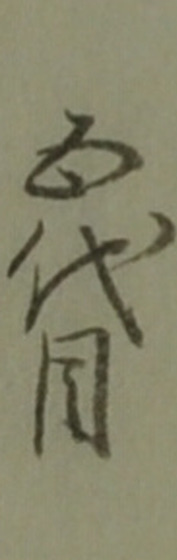五代目
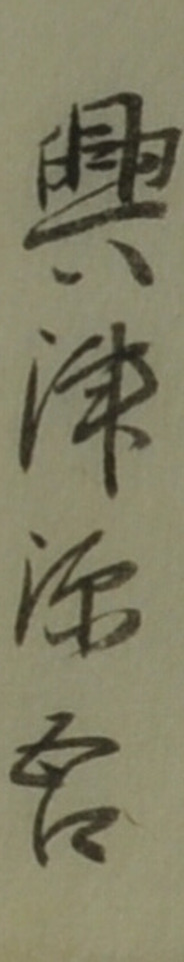奥津源吾
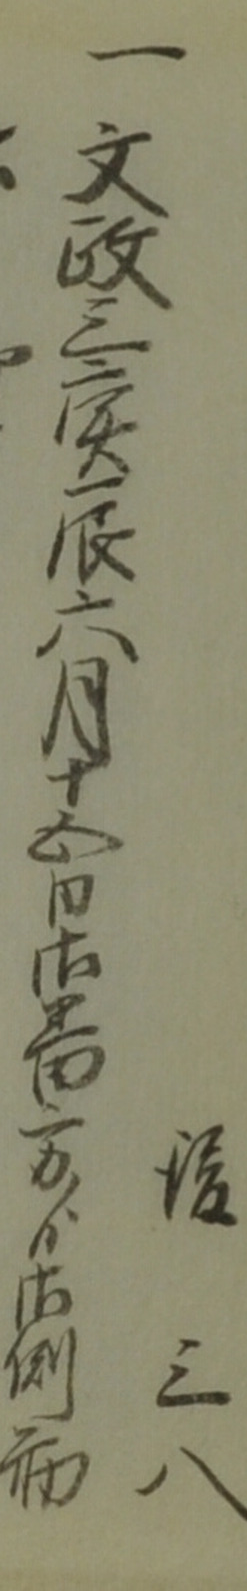一文政三辛辰六月十五日御番方ゟ御側勤
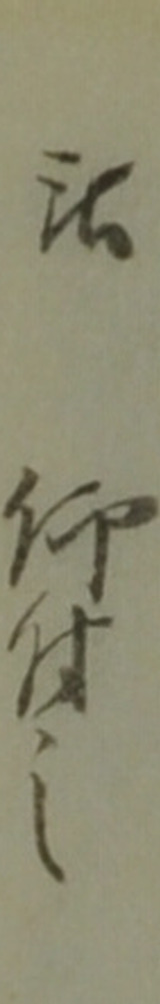被仰付之
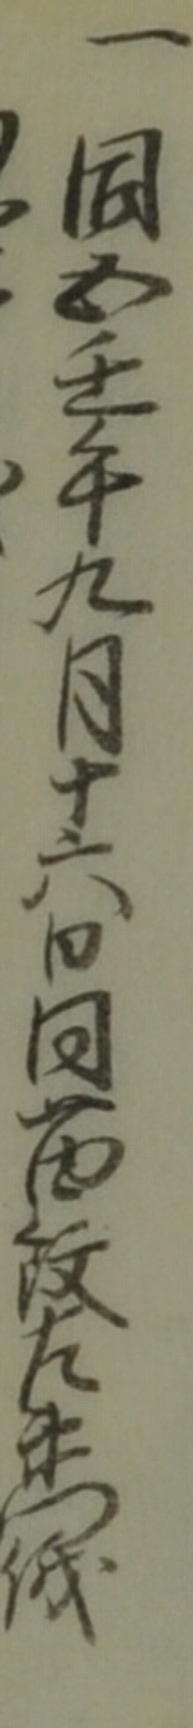一同五壬午九月十六日同苗紋左衛門儀
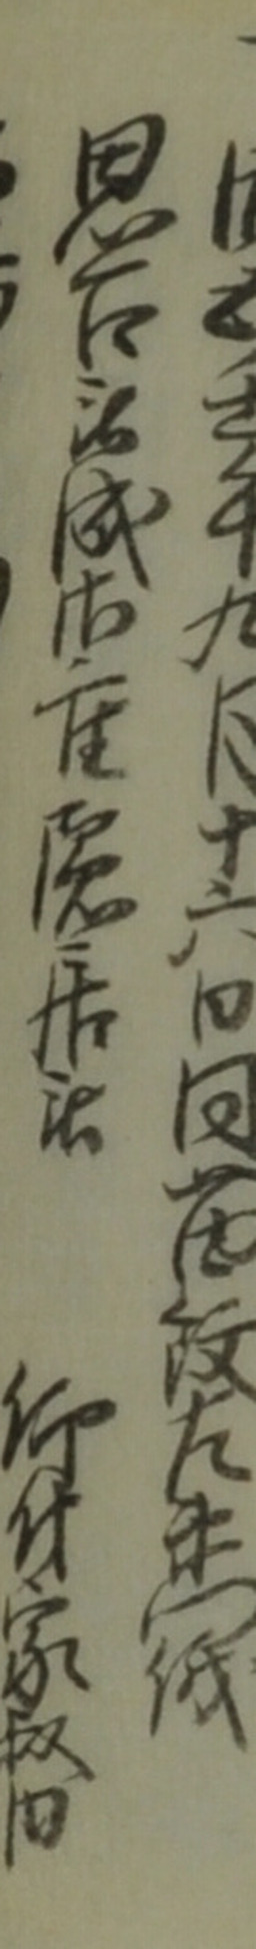思召被成御雇隠居被仰付家督
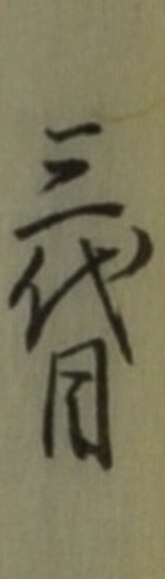三代目
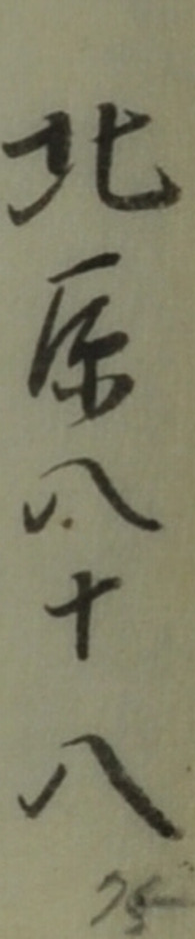北原八十八
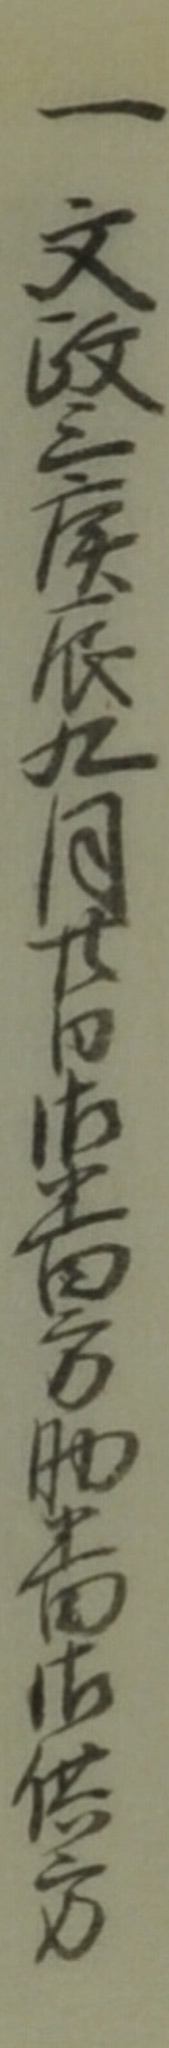一文政三庚辰九月廿日御番方助番御供方
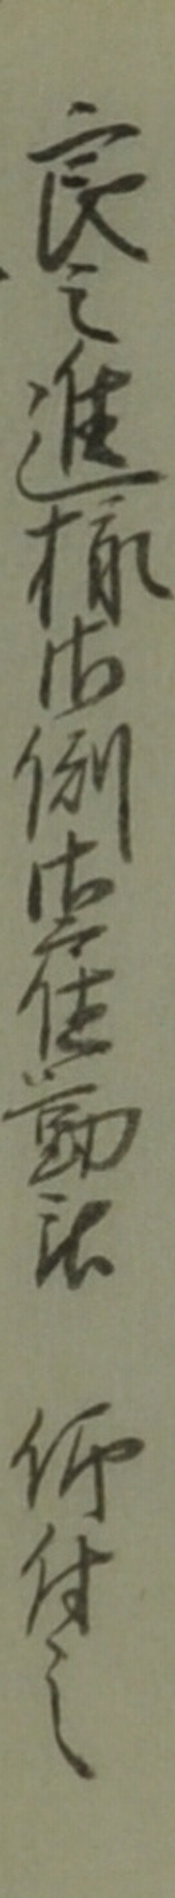良之進様御側御雇勤被仰付之
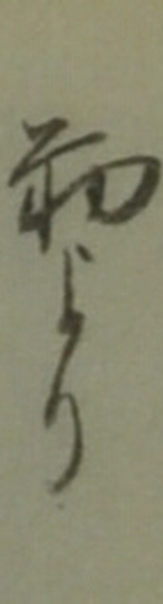勤より
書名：諸御役代々録（五）
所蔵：伊那市立高遠町図書館・合同会社AMANE
